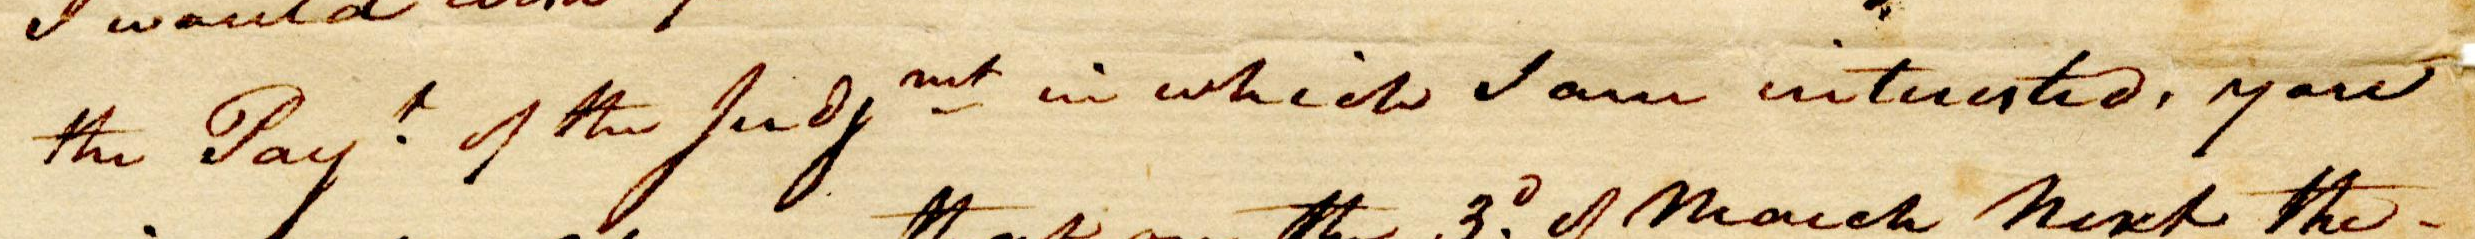the Pay^t of the Judg^mt in which I am interested, you
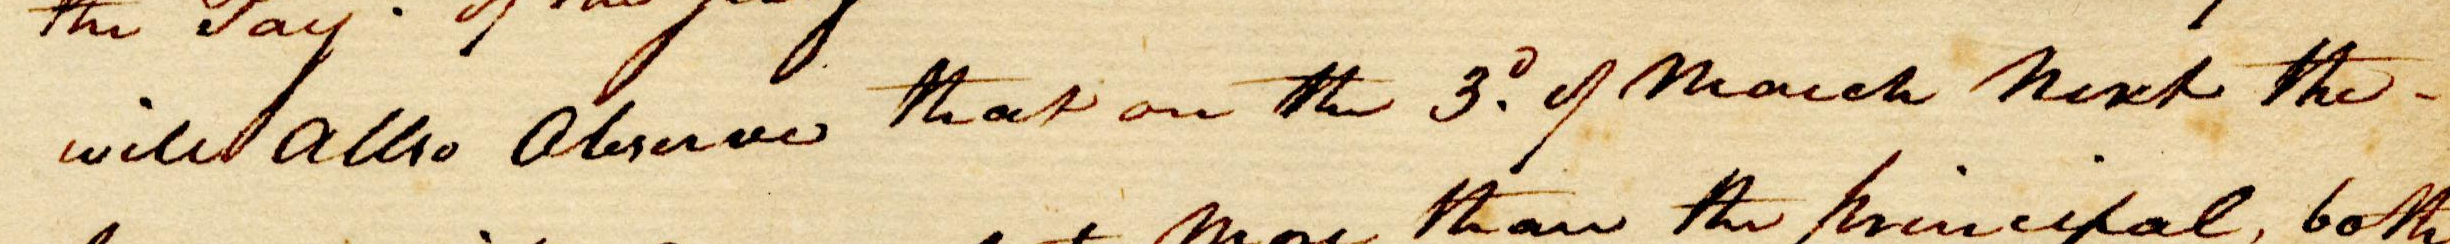will allso Observe that on the 3^d. of March next the
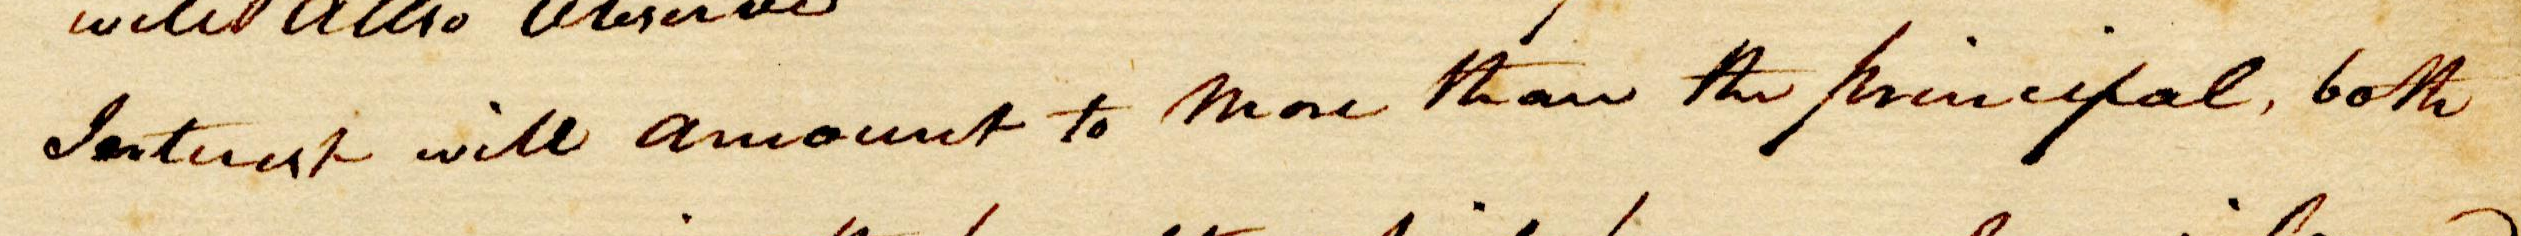Interest will amount to more than the principal, both
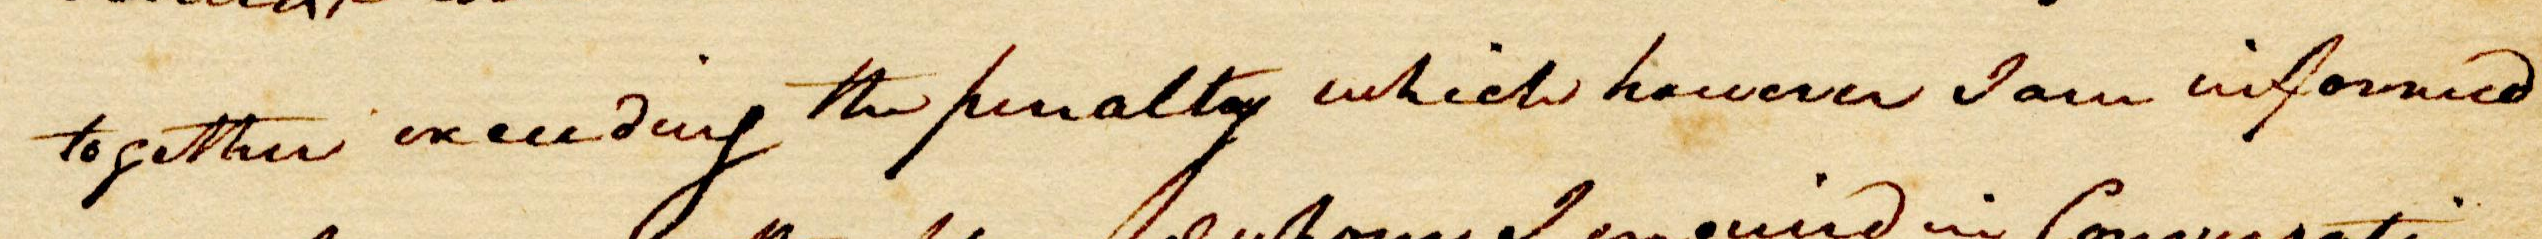together exceeding the penalty which however I am informed
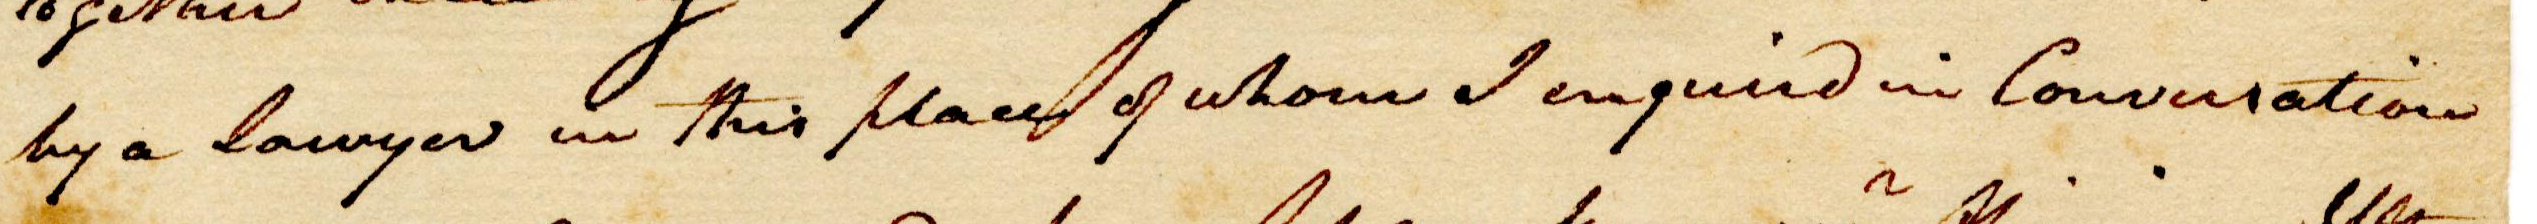by a lawyer in this place of whose I inquired in Conversation
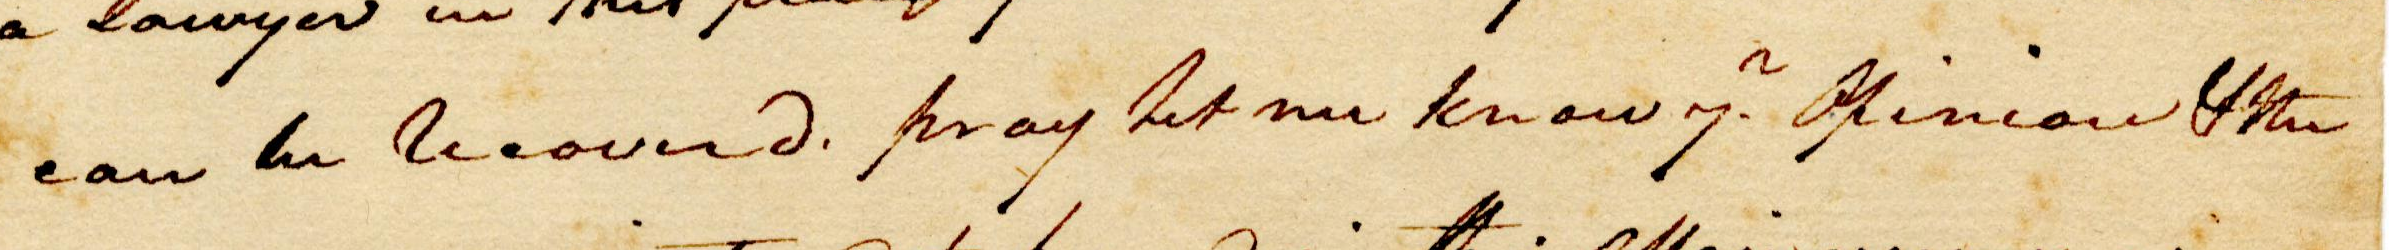can be recover'd pray let me know y^r. opinion & the
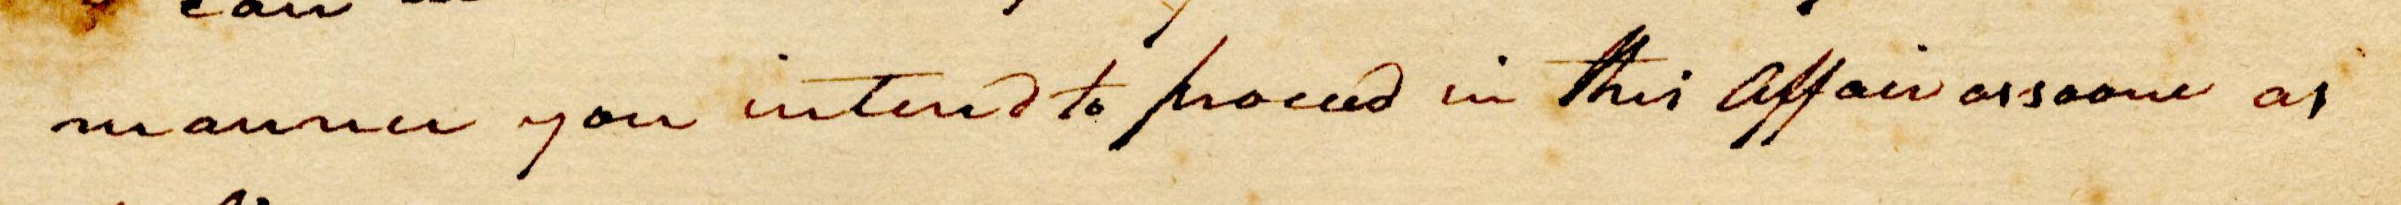manner you intend to proceed in this Affair as soone as
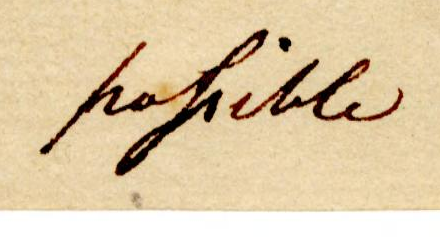possible
